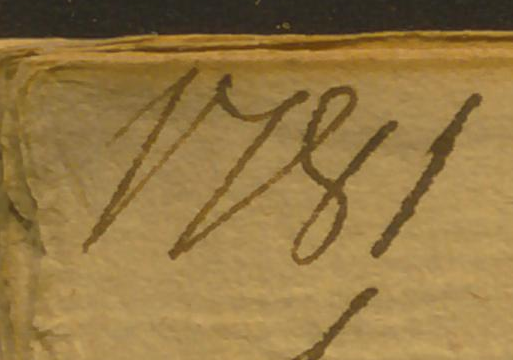1781
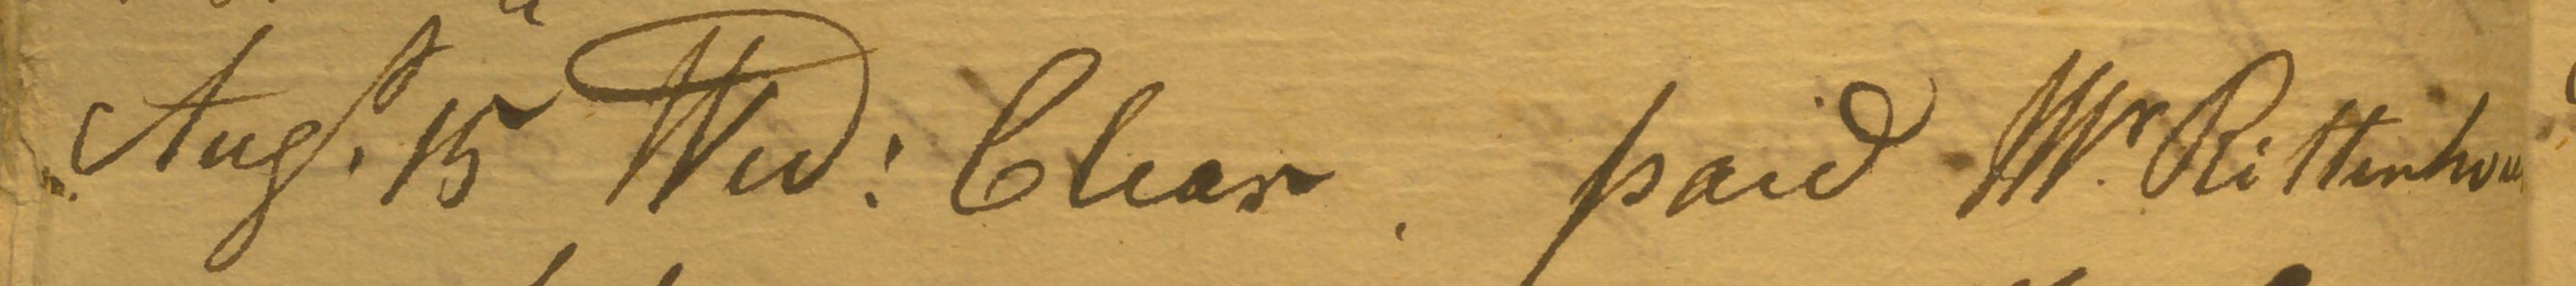Aug^t. 15^th Wed: Clear. paid M^r. Rittenhouse
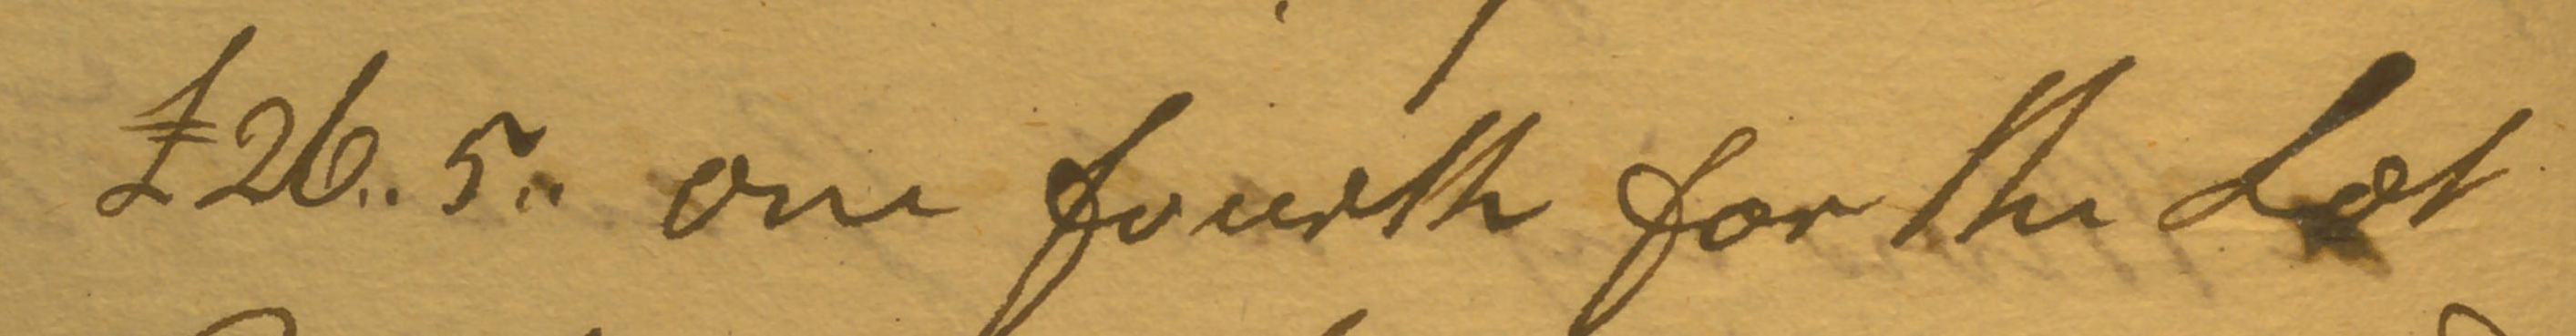£26.5 one fourth for the Lot
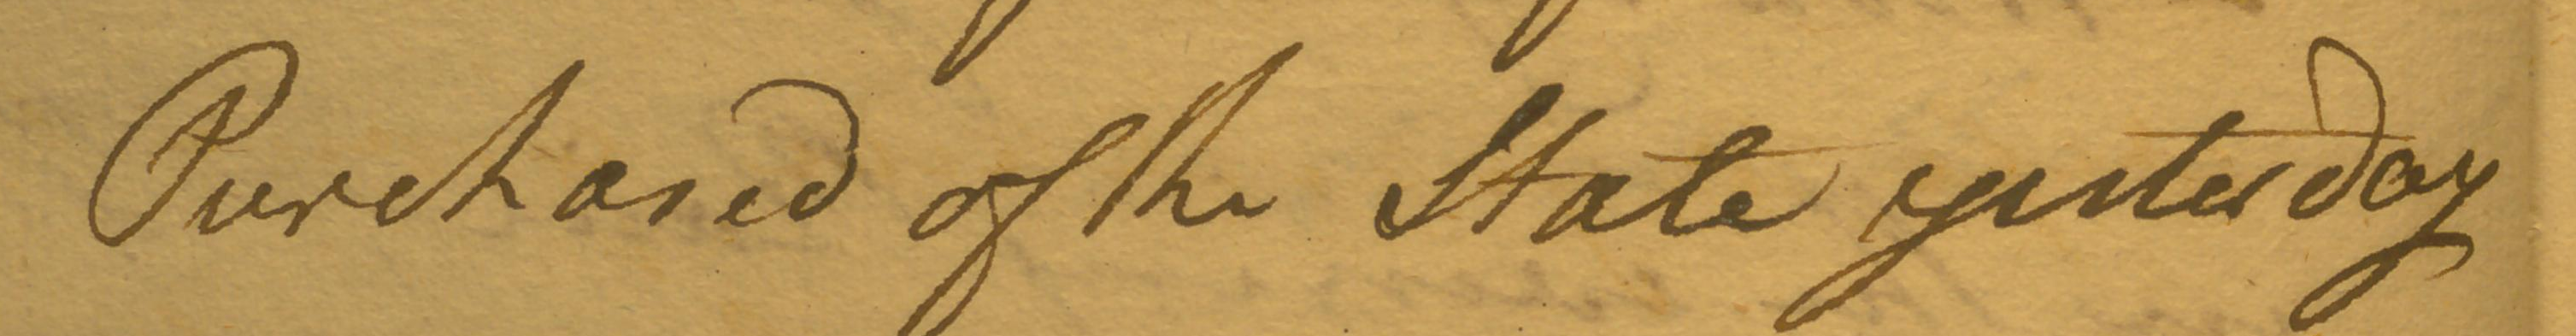Purehased of the State yesterday
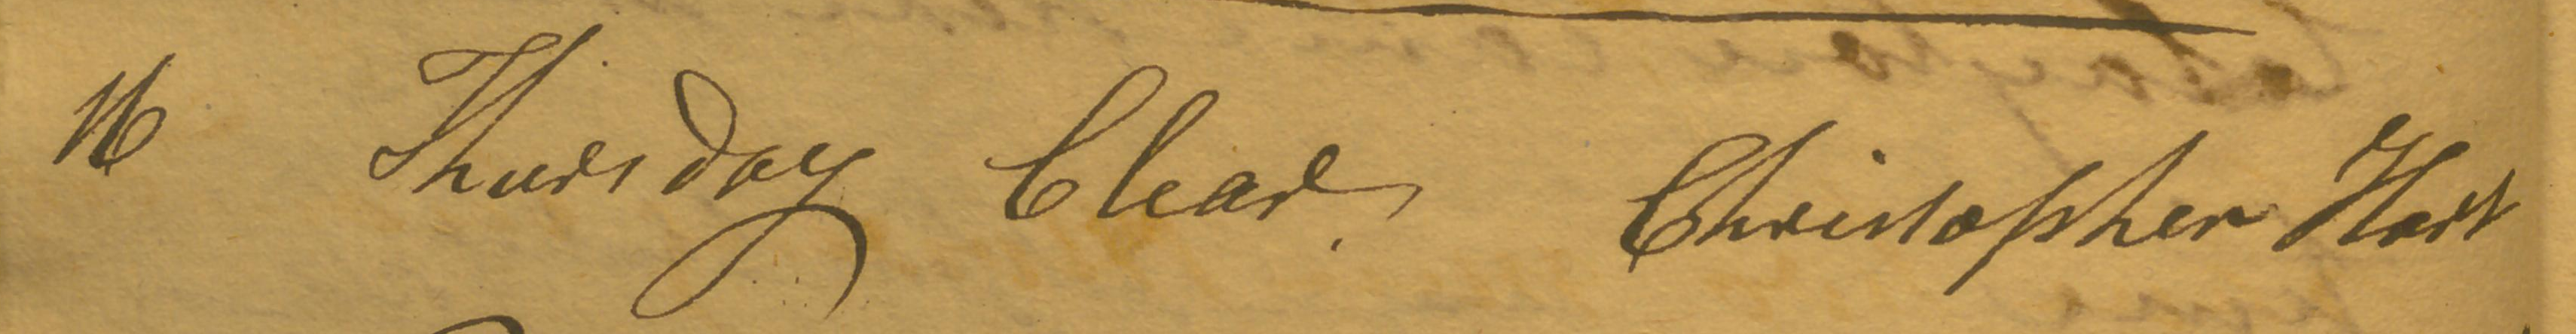16 Thursday Clear Christopher Hart
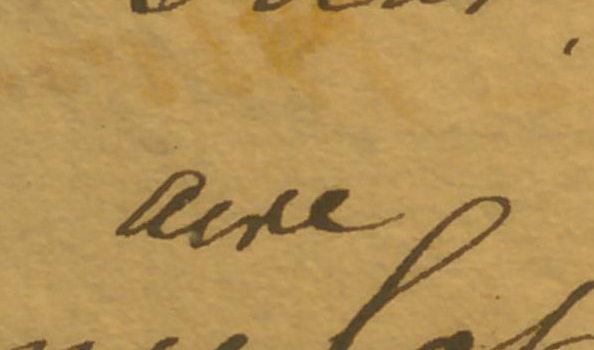acre
